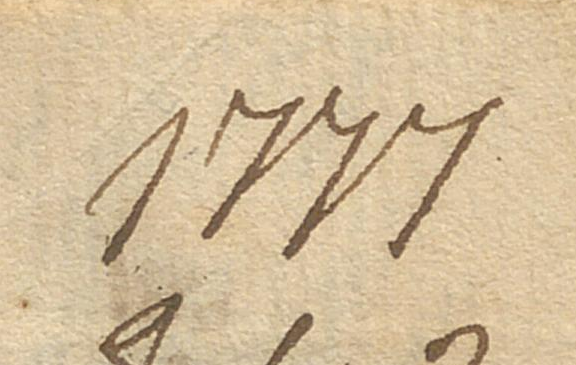1777
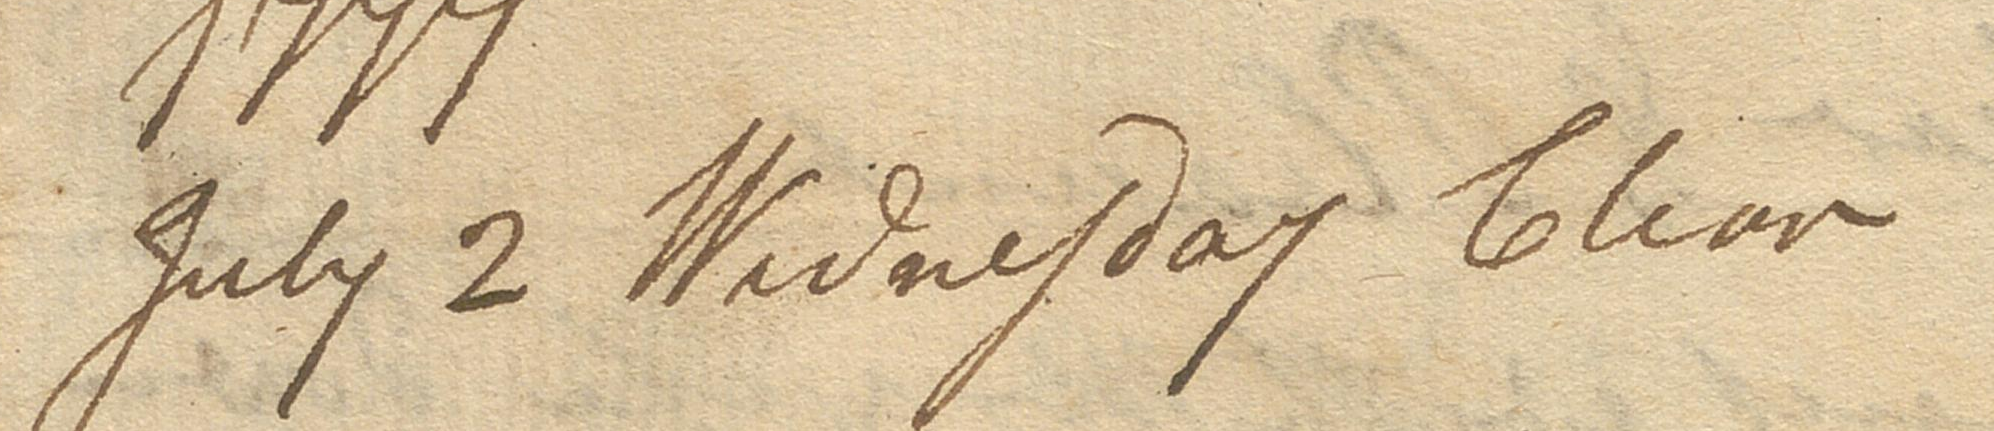July 2 Wednesday Clear
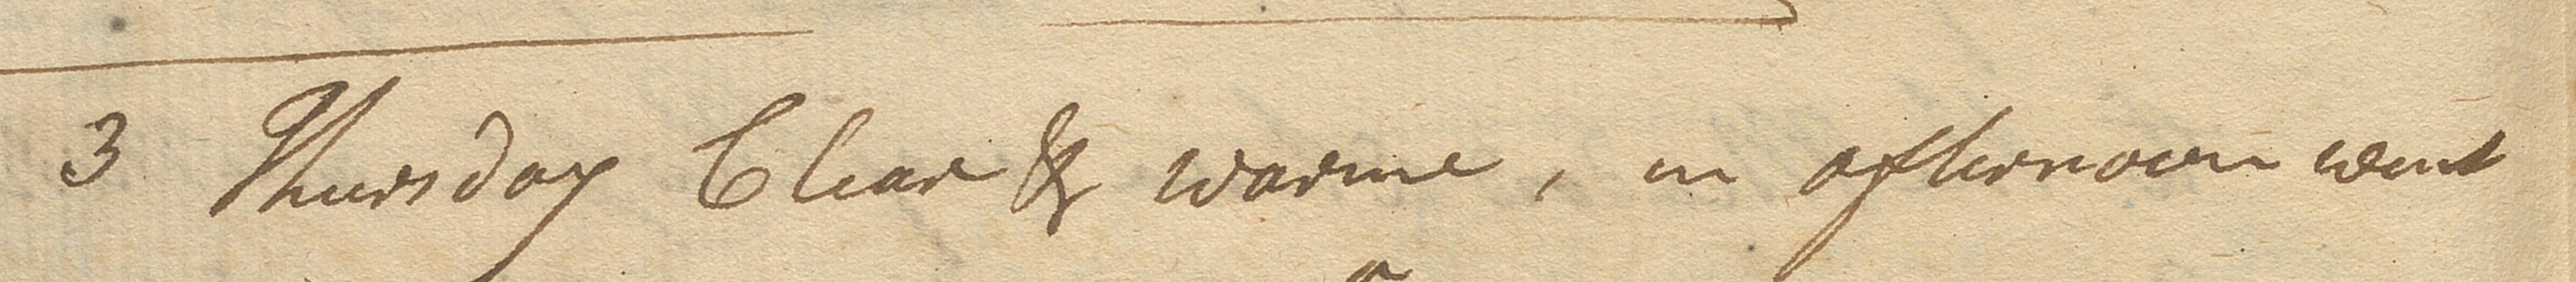3 Thursday Clear & warme, in afternoon went
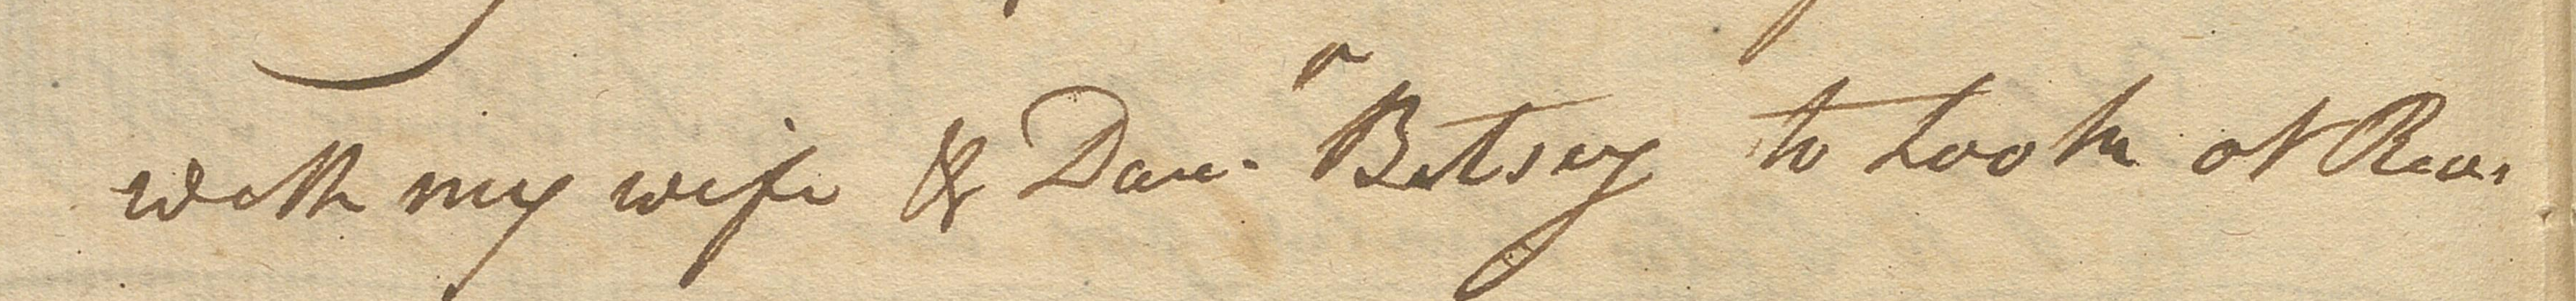with my wife & Dau^r. Betsey to Look ot Reas
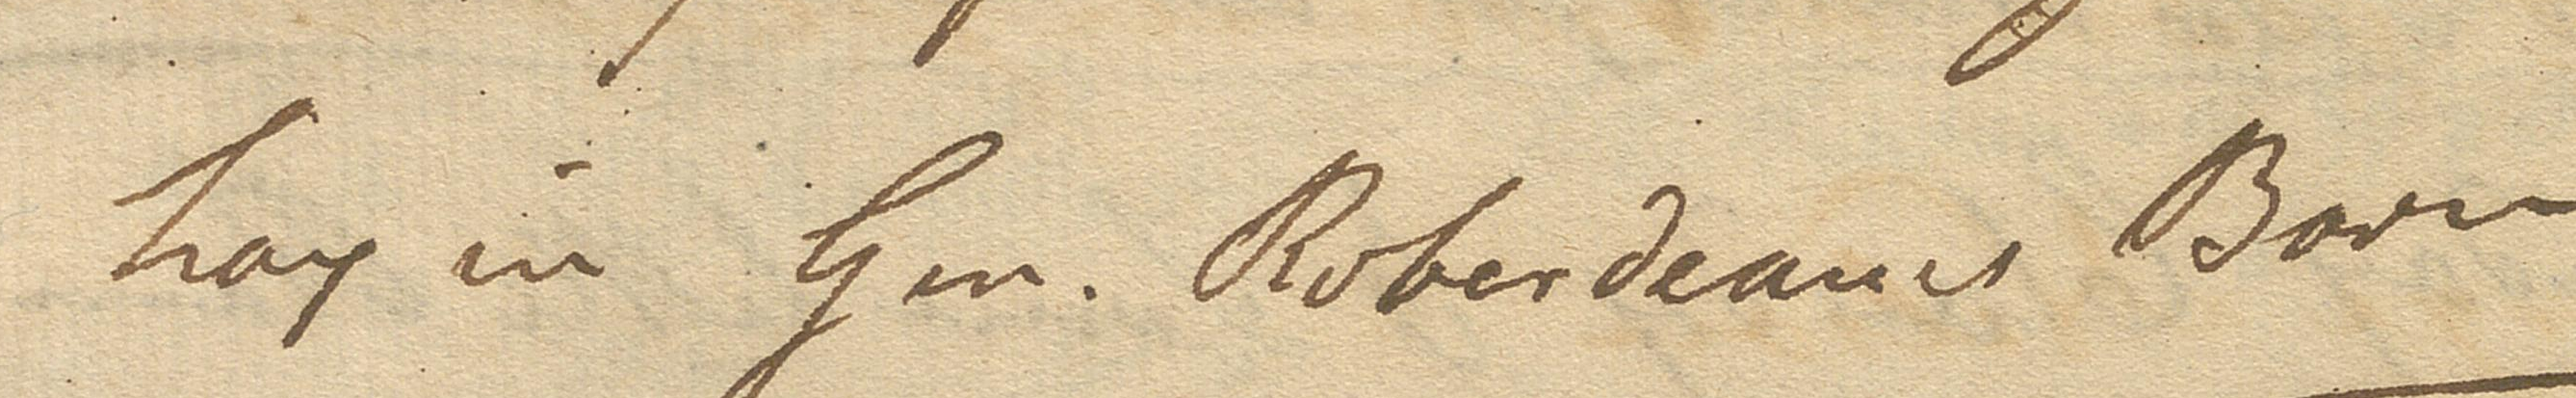hay in Genl. Roberdeams Barn
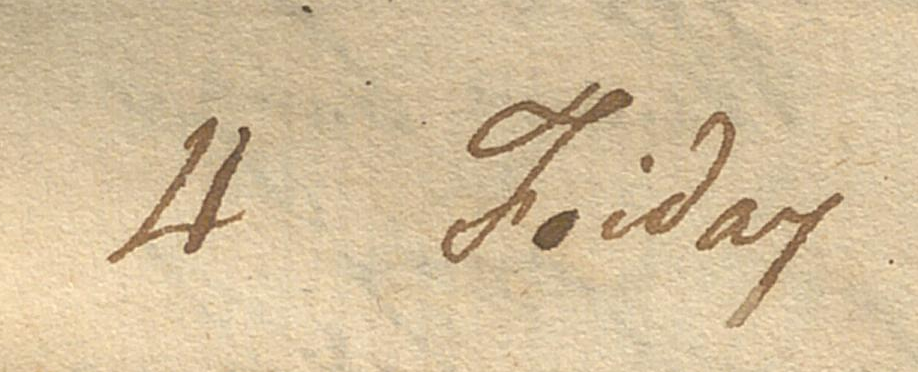4 Friday
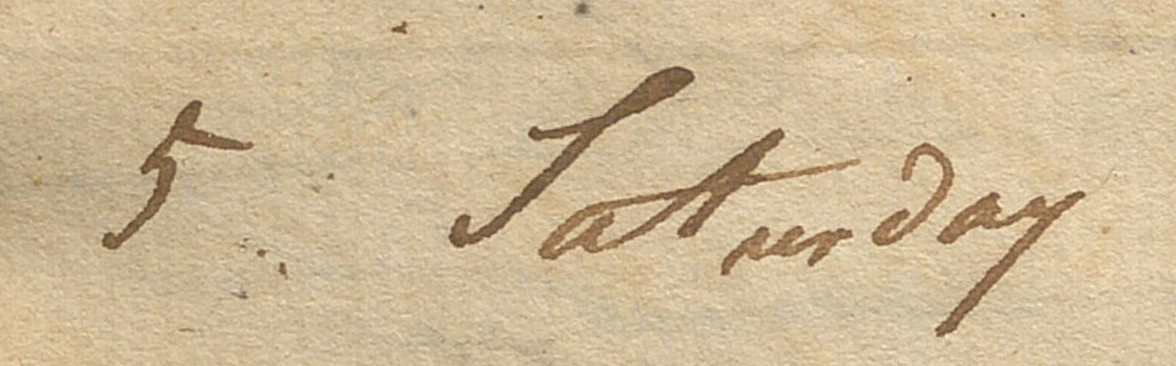5 Saturday
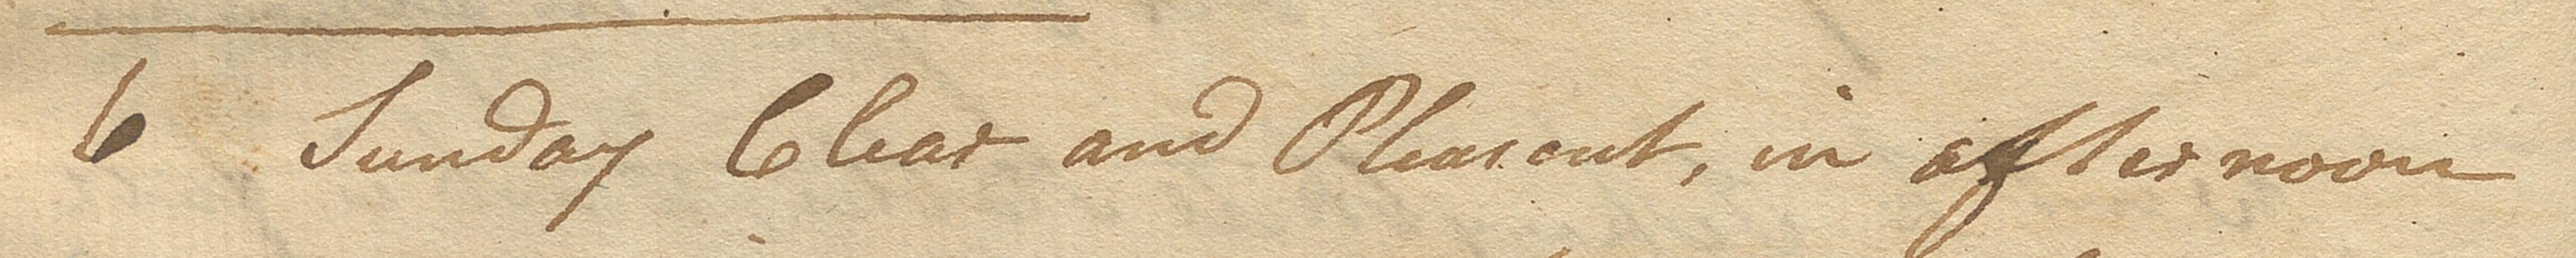6 Sunday Clear and Pleasent, in after noon
